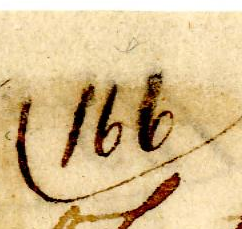166
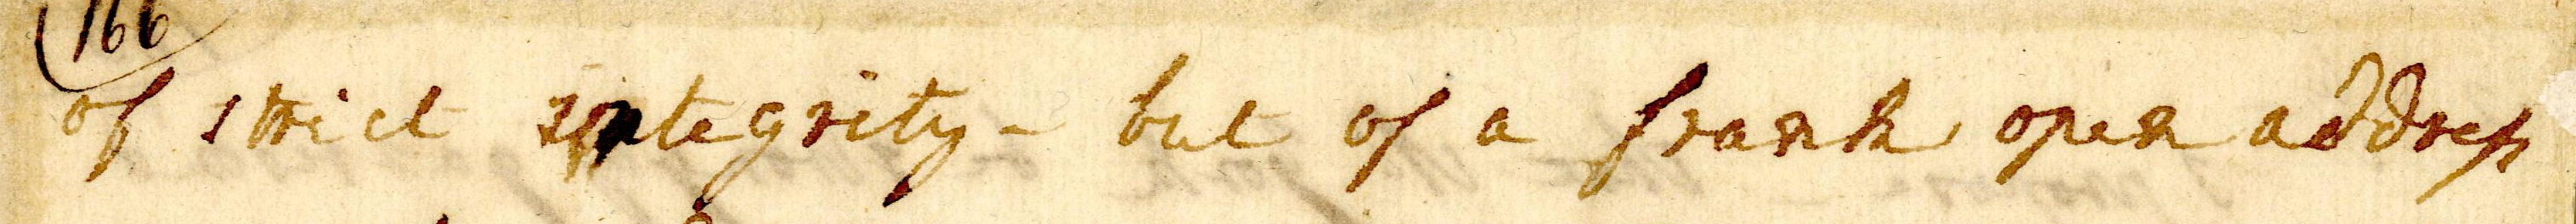of strict integrity- but of a frank open address
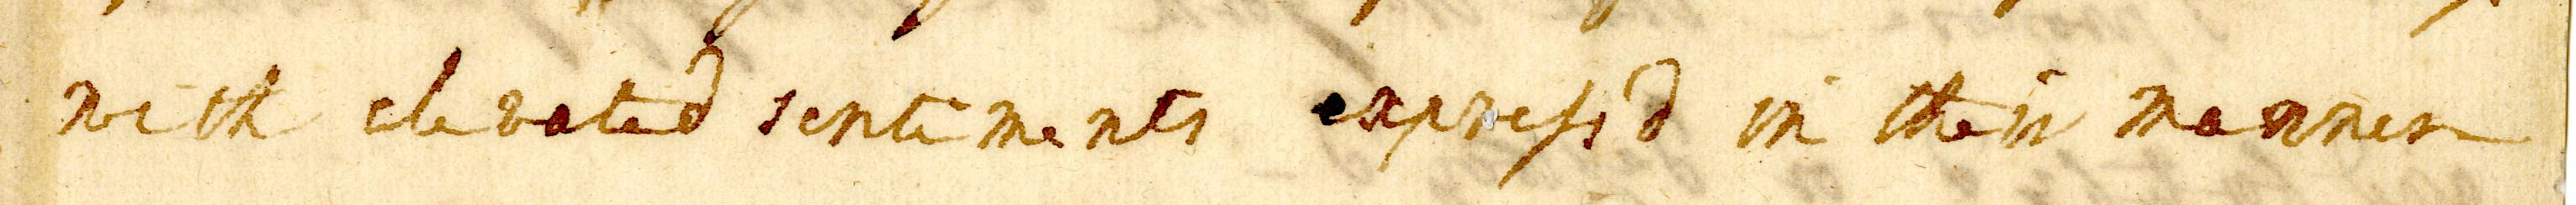with debated sentiments express'd in the in manner
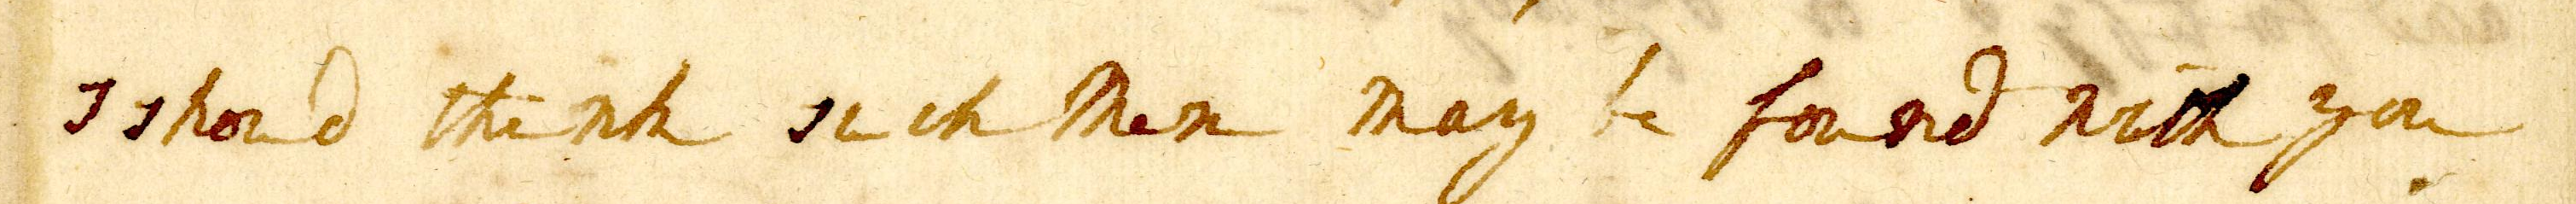I shou'd think such Men may be found with you
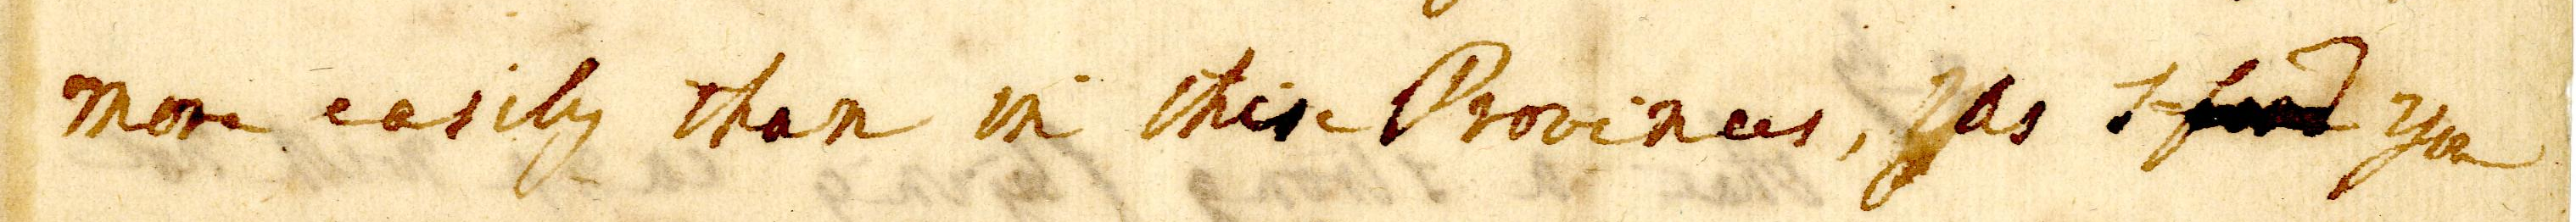more easily than in these Provinces, as [____] you
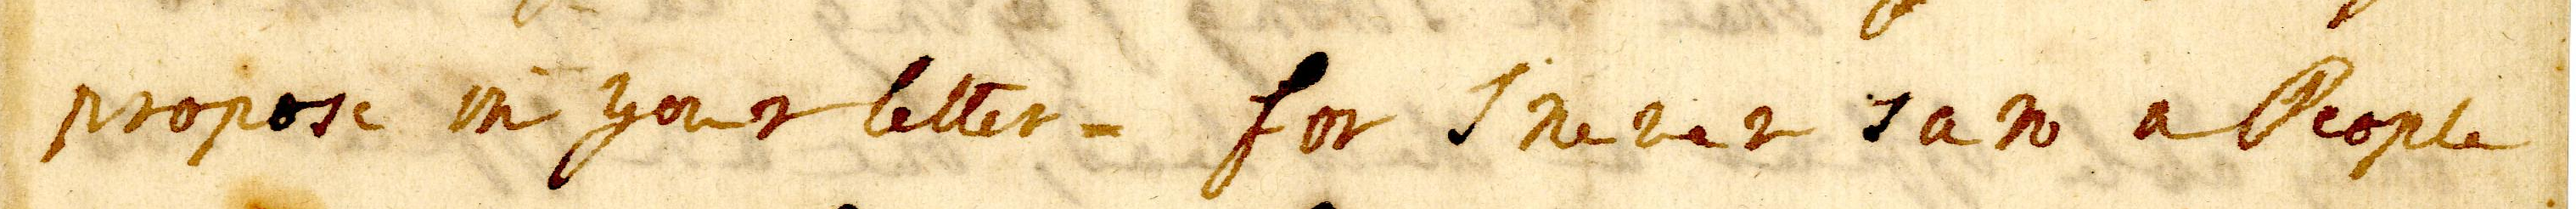propose in your letter- for I never saw a People
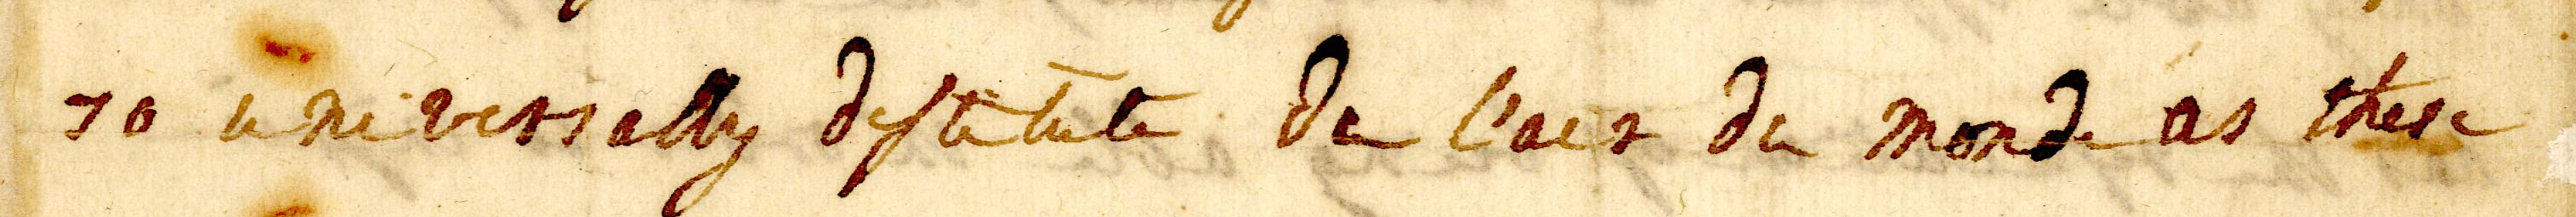so universally destitute de l'art de mond as these
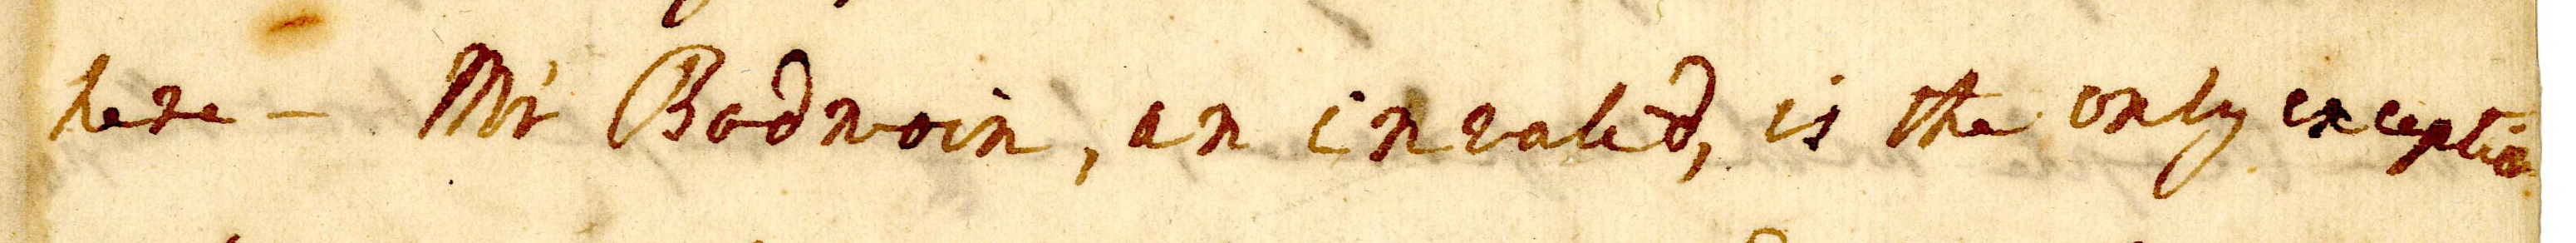here- Mr Bodwoin, an invalid, is the only exception
